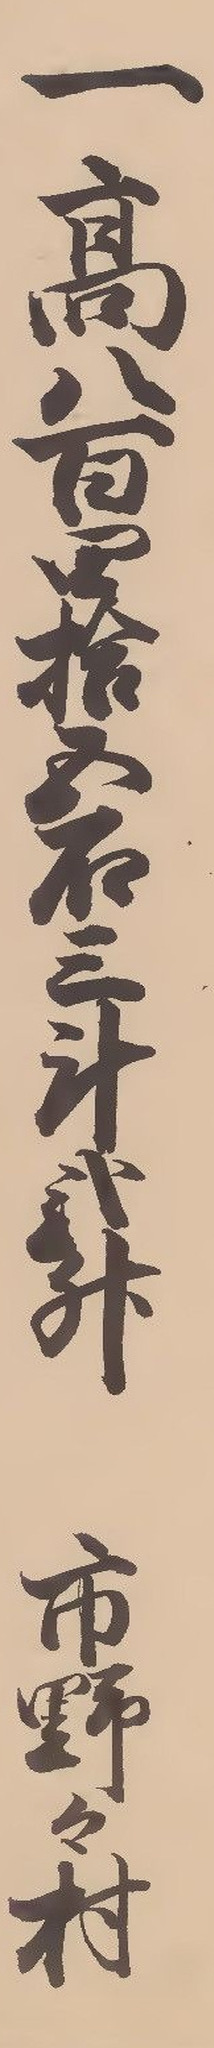一高八百四拾五石三斗弐升市野々村
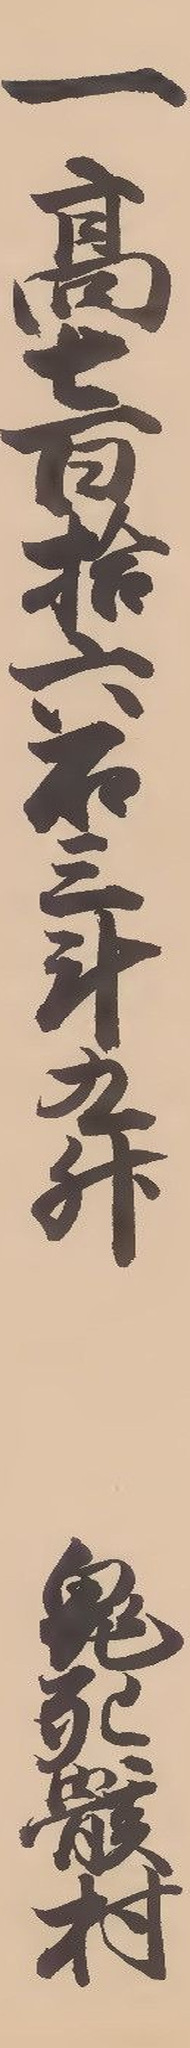一高七百拾六石三斗九升鬼死骸村
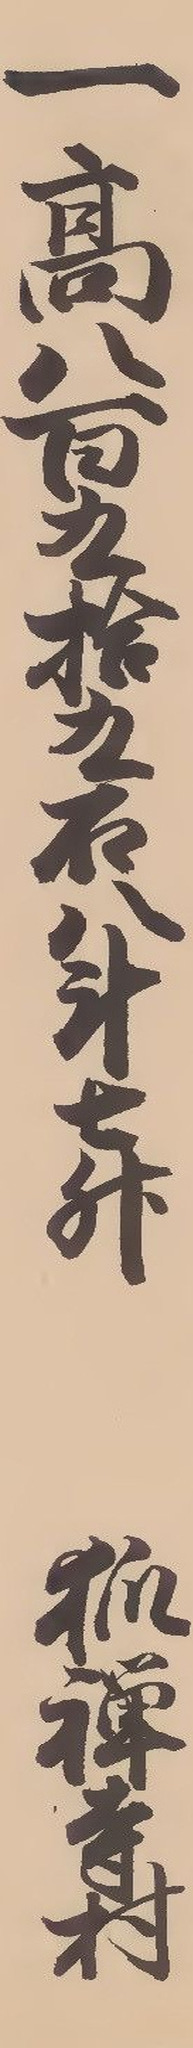一高八百九拾九石八斗七升狐禅寺村
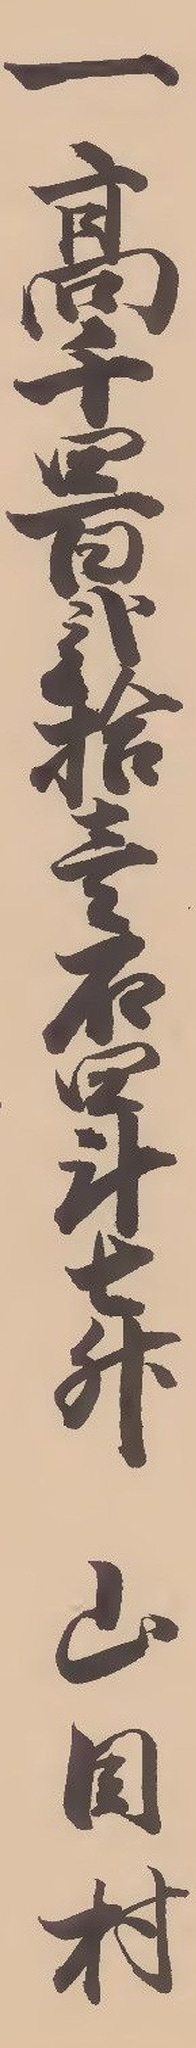一高千四百弐拾壱石四斗七升山目村
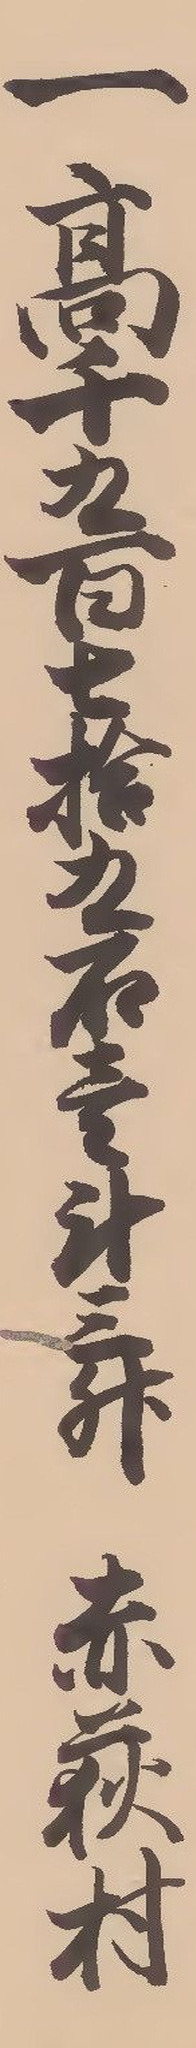一高千九百七拾五石壱斗三升赤荻村

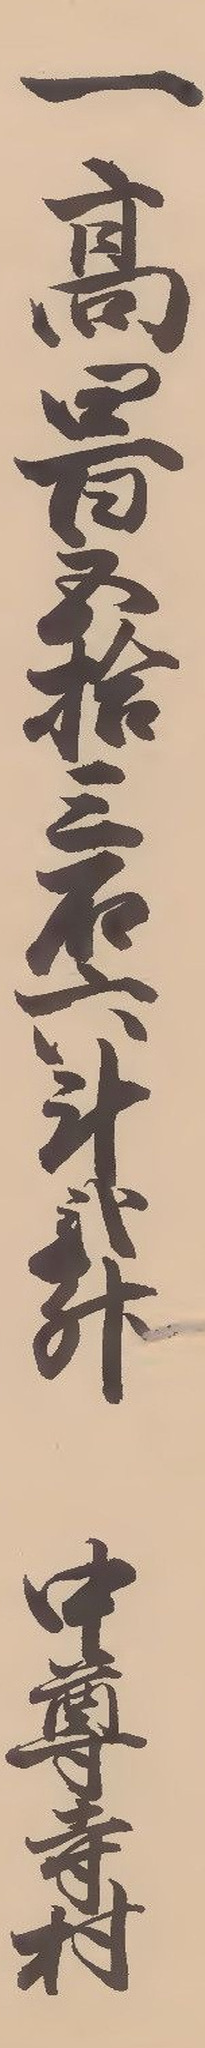一高四百五拾三石六斗弐升中尊寺村
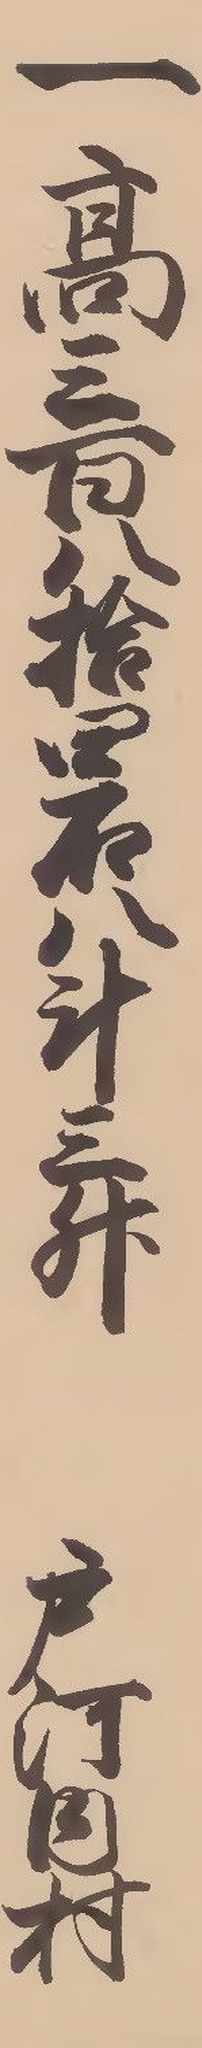一高三百八拾四石八斗三升戸河内村
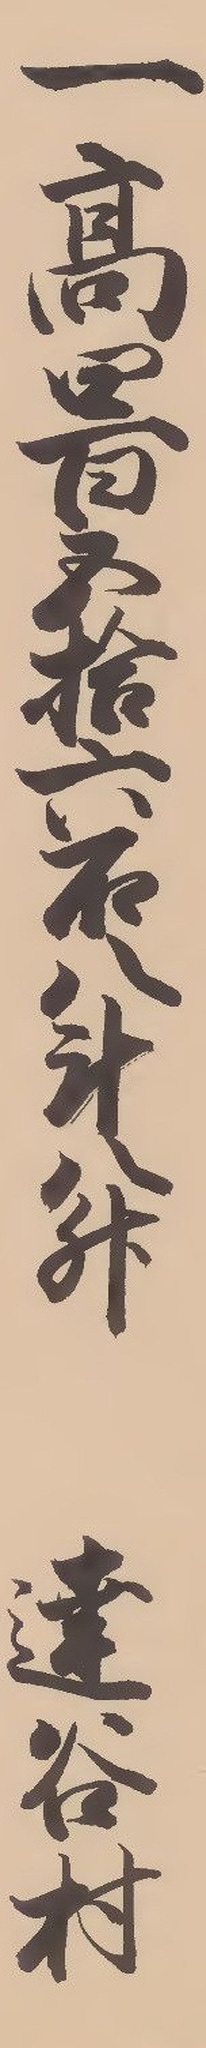一高四百五拾六石八斗八升達谷村
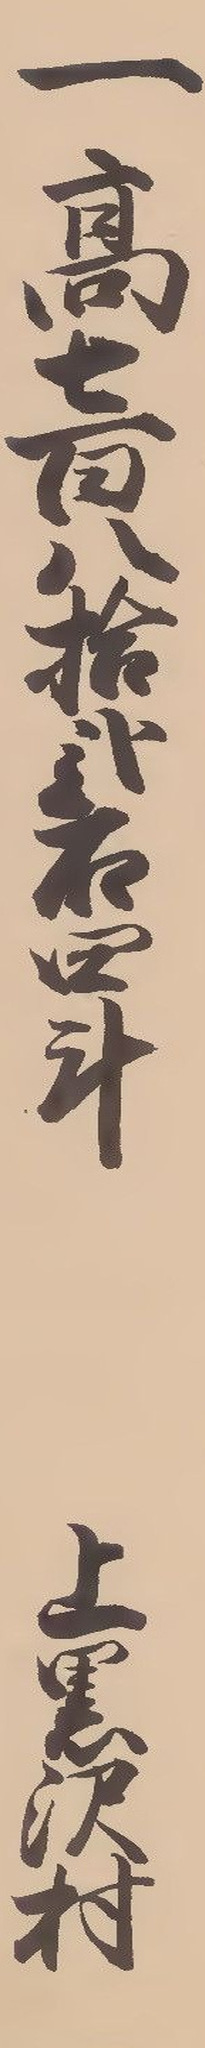一高七百八拾弐石四斗上黒沢村
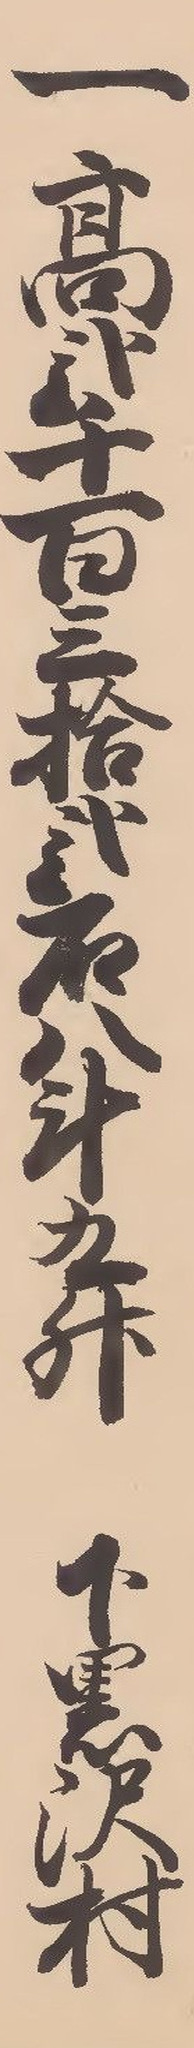一高弐千百三拾弐石八斗九升下黒沢村
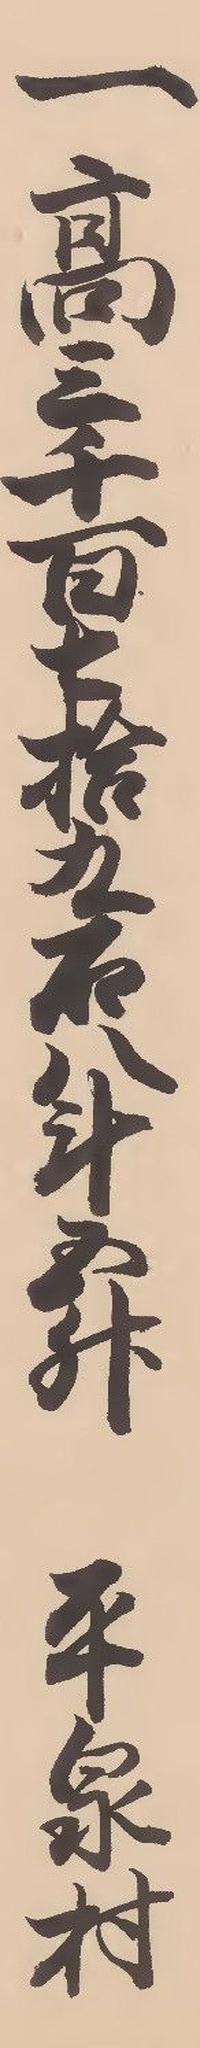一高三千百七拾九石八斗五升平泉村
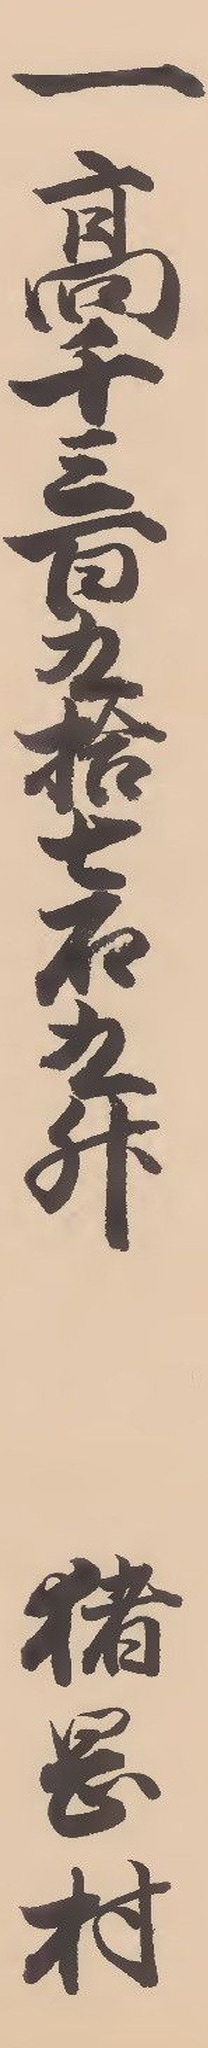一高千三百九拾七石九升猪岡村
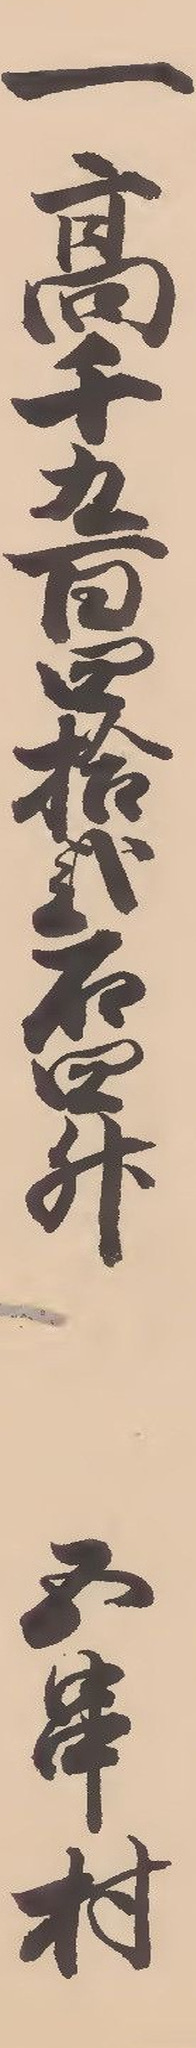一高千九百四拾弐石四升五串村

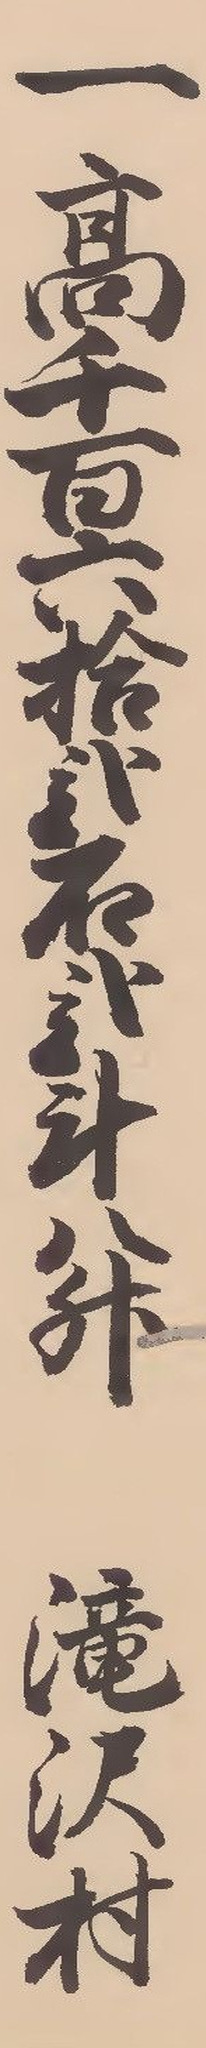一高千百六拾弐石弐斗八升滝沢村
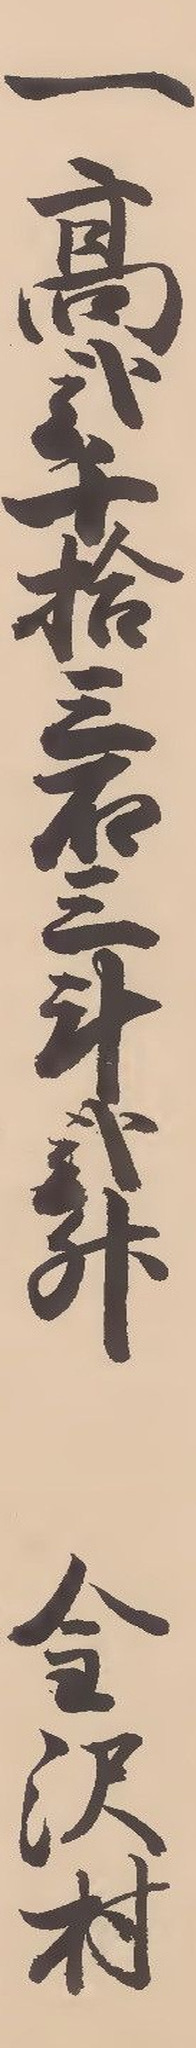一高弐千拾三石三斗弐升金沢村
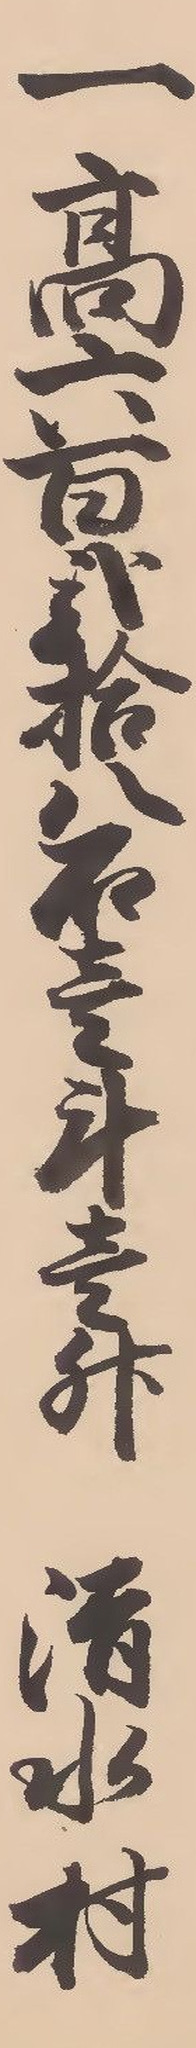一高六百弐拾八石壱斗壱升清水村
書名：陸奥国郷帳　５
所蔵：国立公文書館 National Archives of Japan
